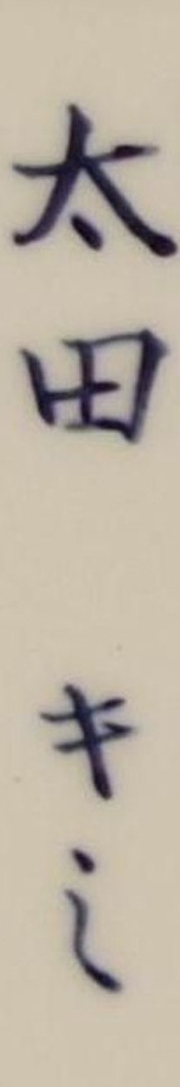太田キミ
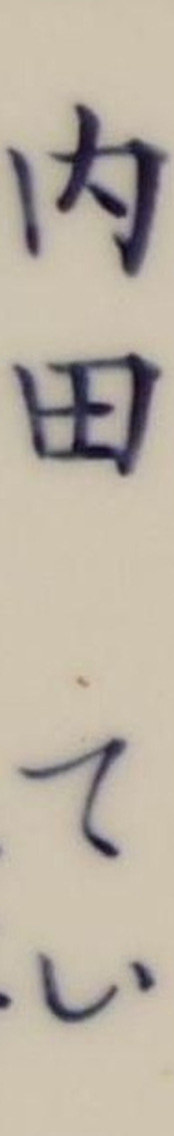内田てい
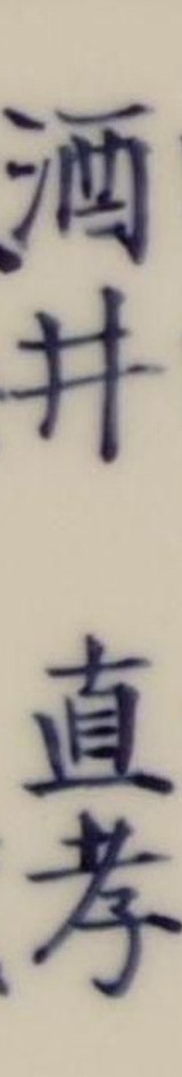酒井直孝

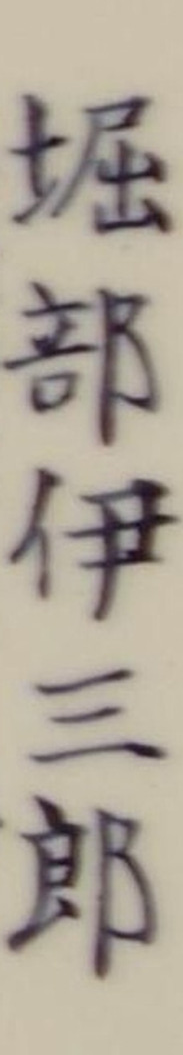堀部伊三郎
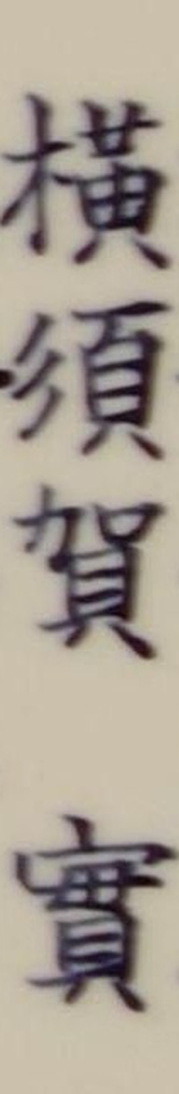横須賀實
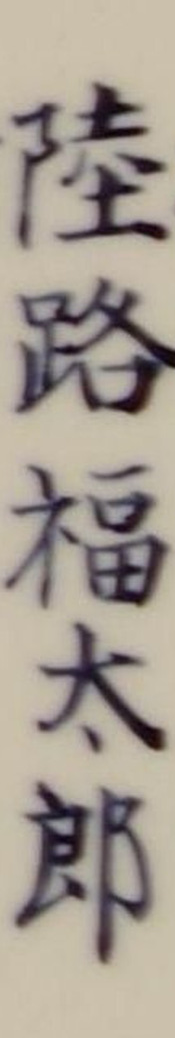陸路福太郎
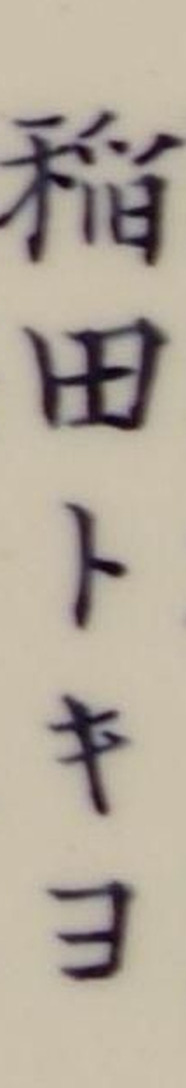稲田トキヨ
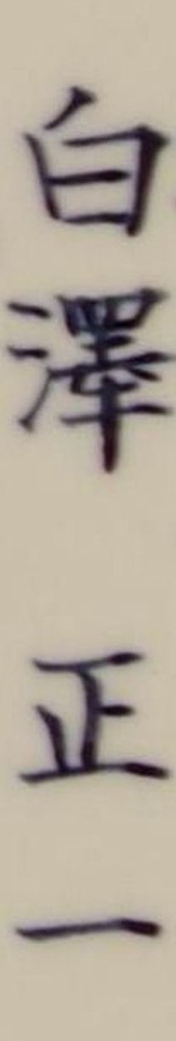白澤正一
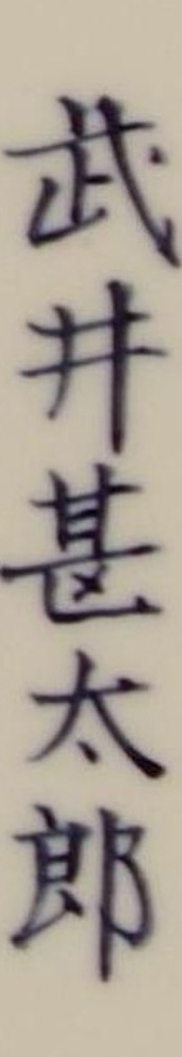武井甚太郎
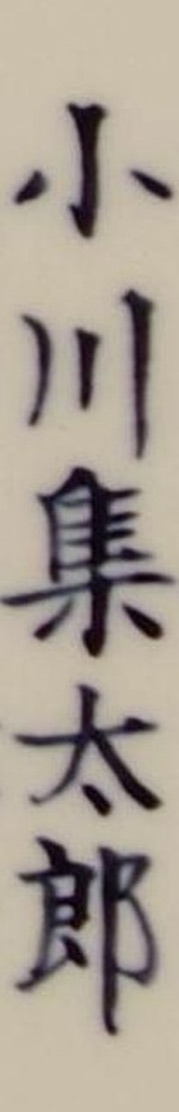小川集太郎
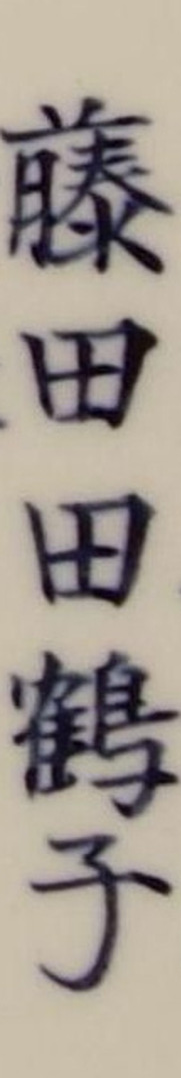藤田田鶴子
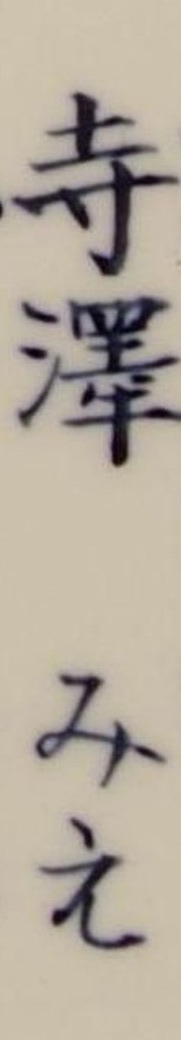寺澤みえ
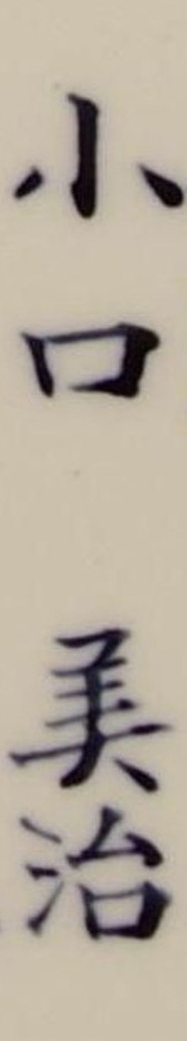小口美治
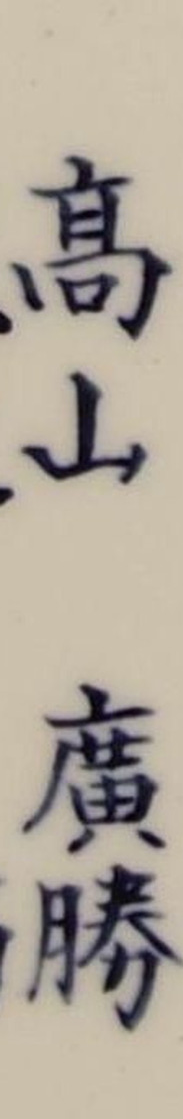高山廣勝
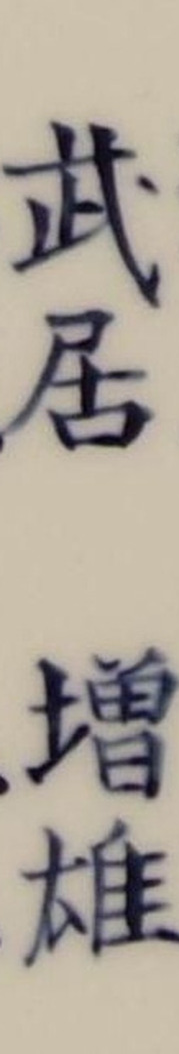武居増雄
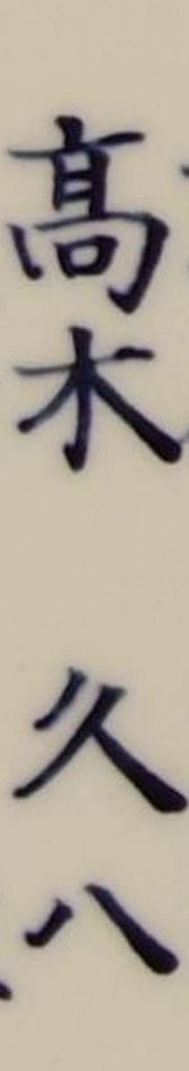高木久八
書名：M~S
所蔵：高野山金剛峯寺
